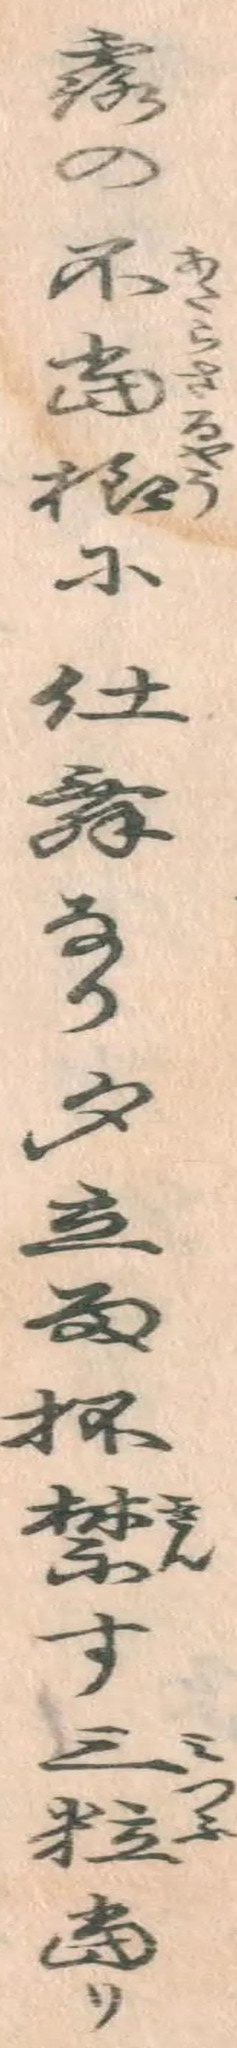露の不当様に仕舞なり夕立雨抔禁す三粒当り
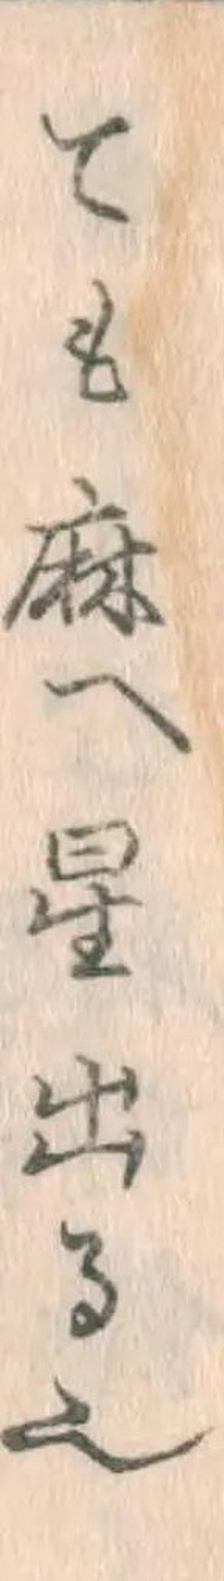ても麻へ星出る也
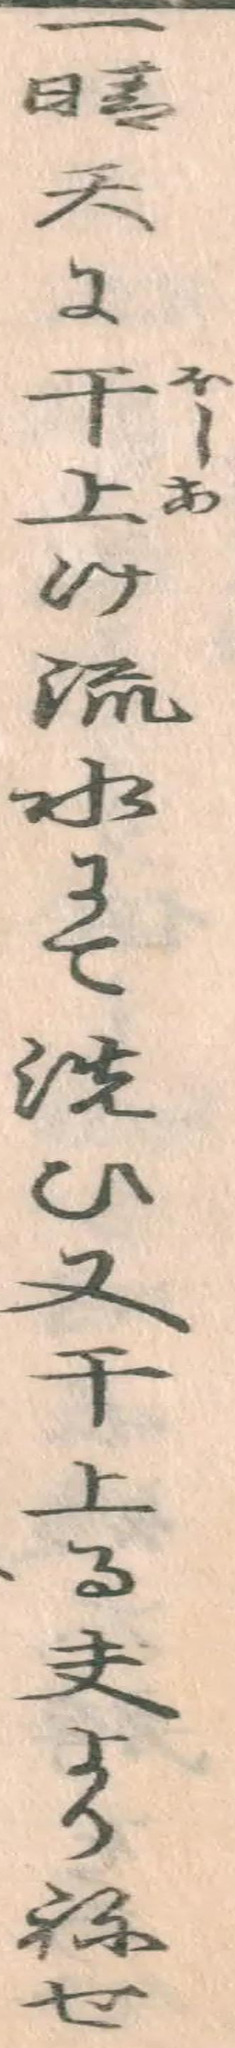一晴天に干上け流水にて洗ひ又干上る夫よりねせ
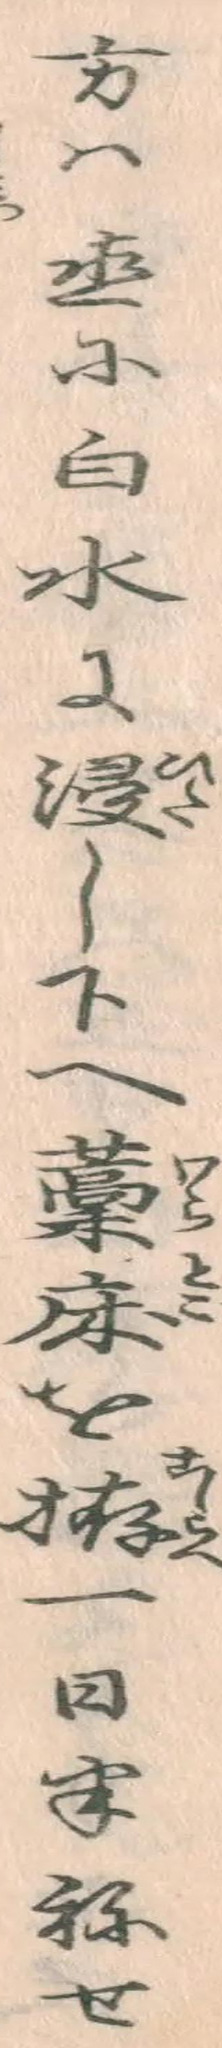方は直に白水に浸し下へ藁床を拵一日半ねせ
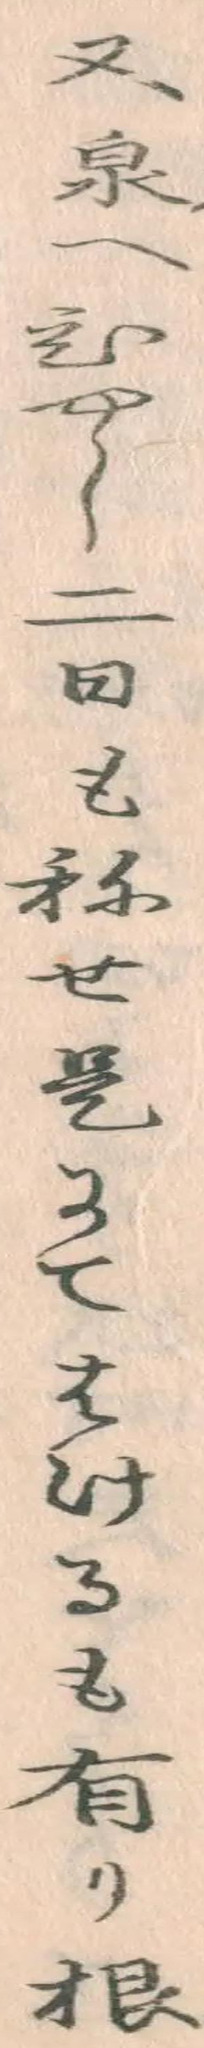又泉へひやし二日もねせ是にてはけるも有り根
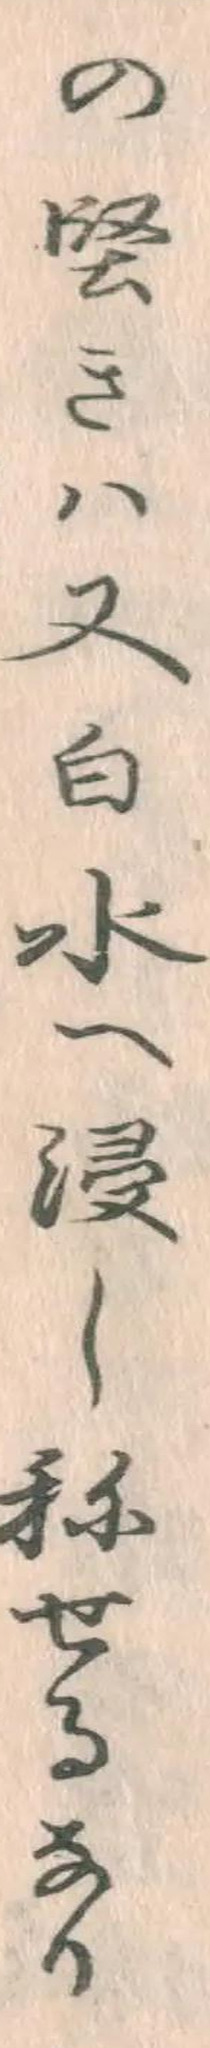の堅きは又白水へ浸しねせるなり
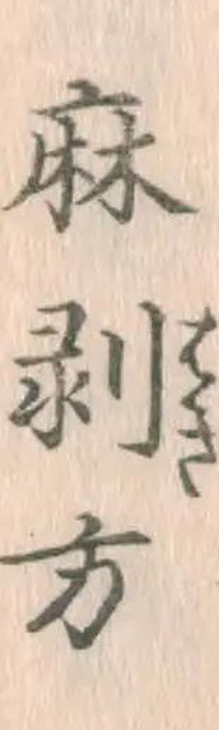麻剥方
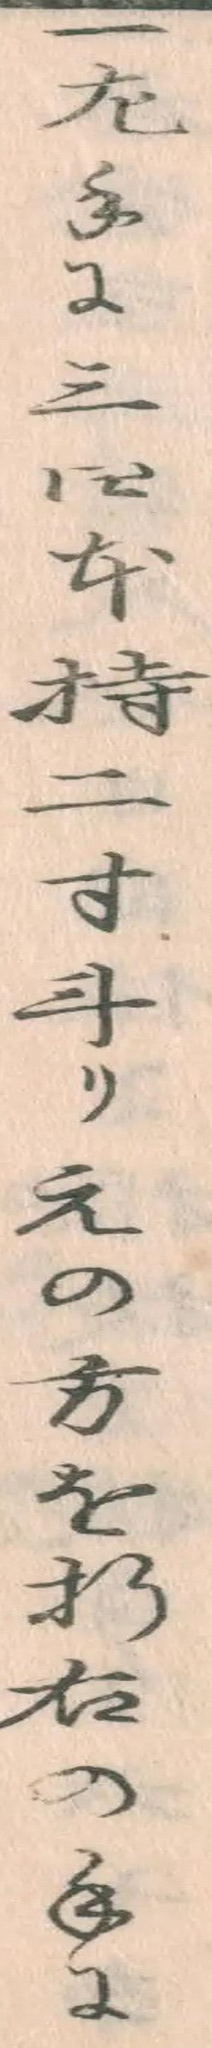一左手に三四本持二寸斗り元の方を折右の手に
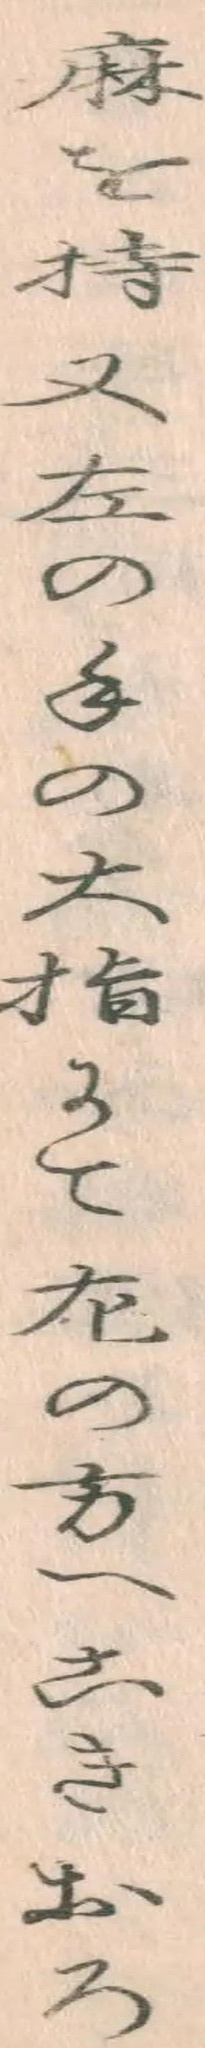麻を持又左の手の大指にて左の方へこきおろ
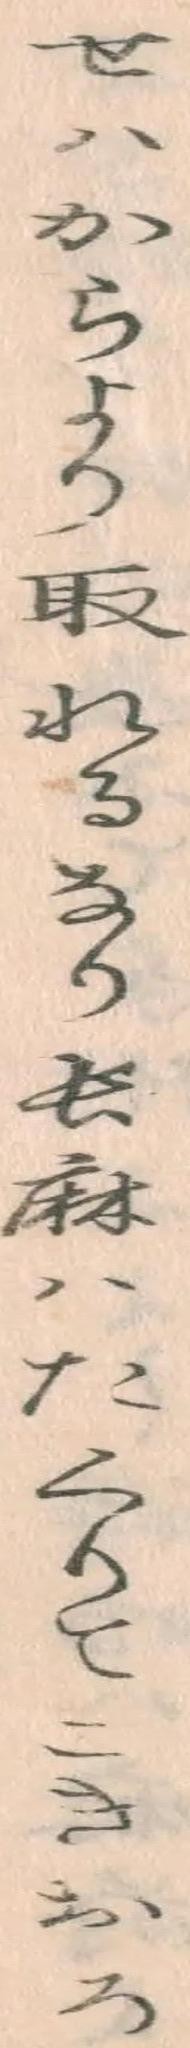せはからより取れるなり長麻はたくりてこきおろ
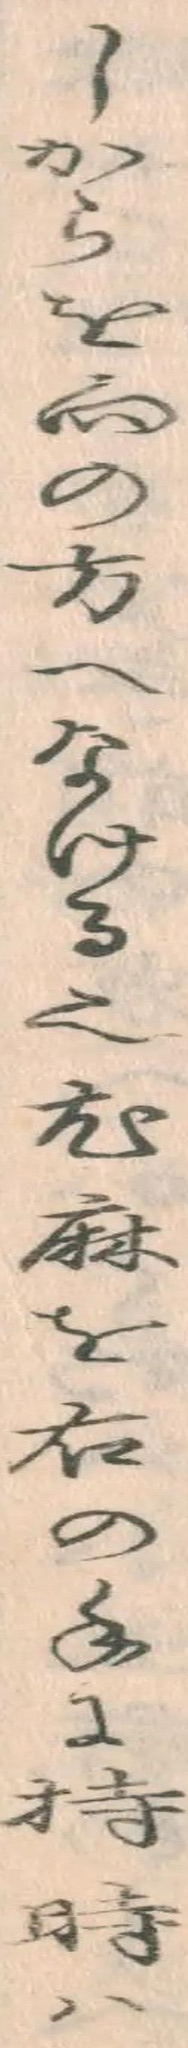しからを向の方へなける也尤麻を右の手に持時は
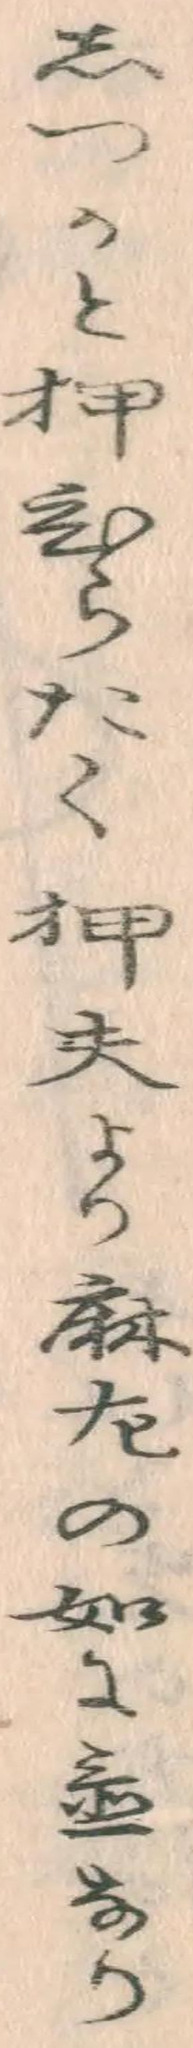しつかと押ひらたく押夫より麻左の如に置なり
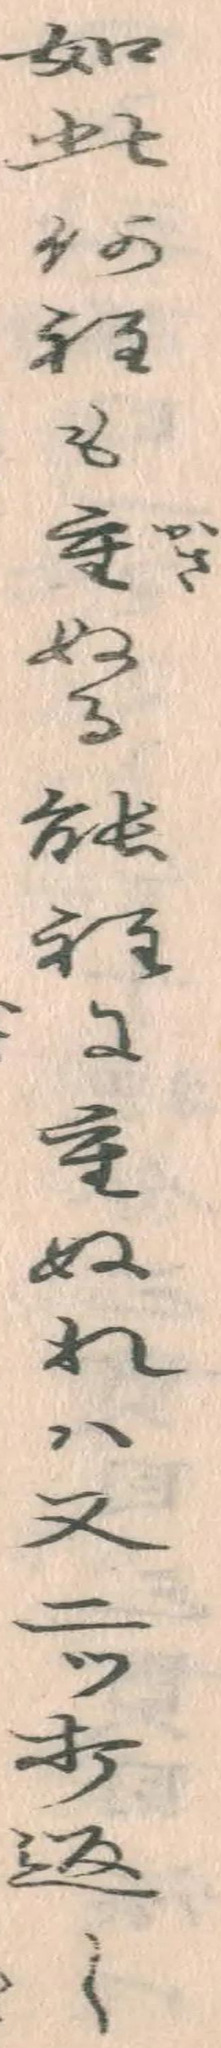如此何程も重ぬる能程に重ぬれは又二ッ打返し
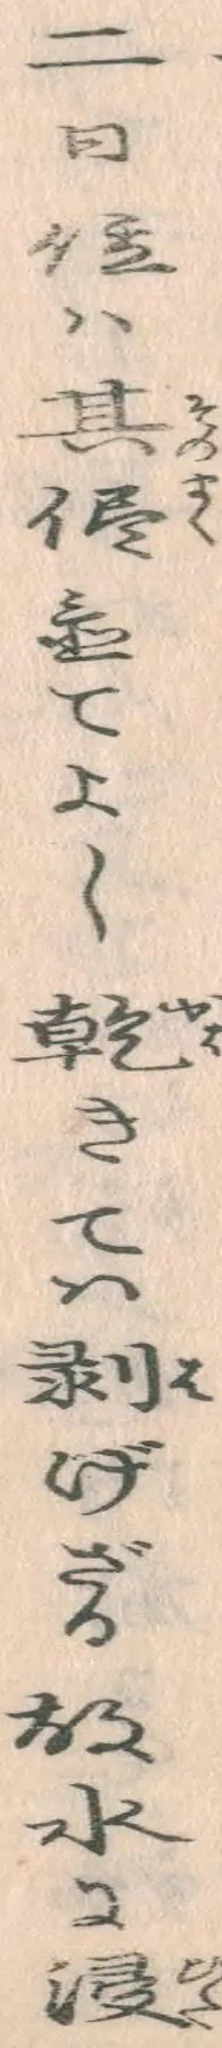二日位は其侭置てよし乾きては剥げざる故水に浸
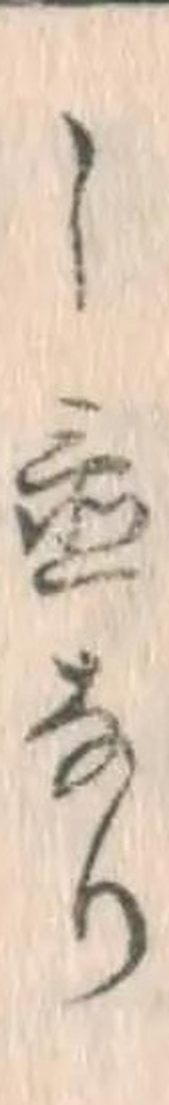し置なり
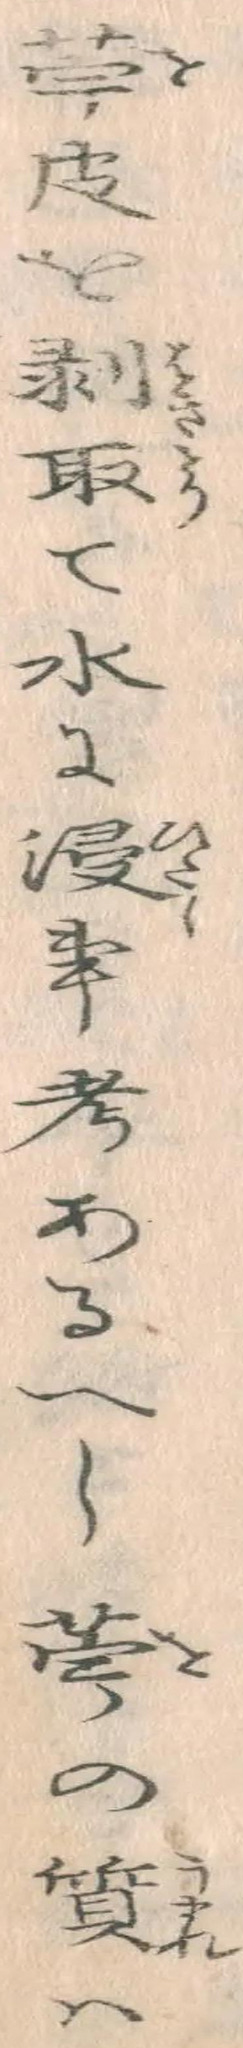一苧皮を剥取て水に浸事考あるへし苧の質は
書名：機織彙編 5巻. [1]
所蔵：国立国会図書館 National Diet Library, JAPAN
